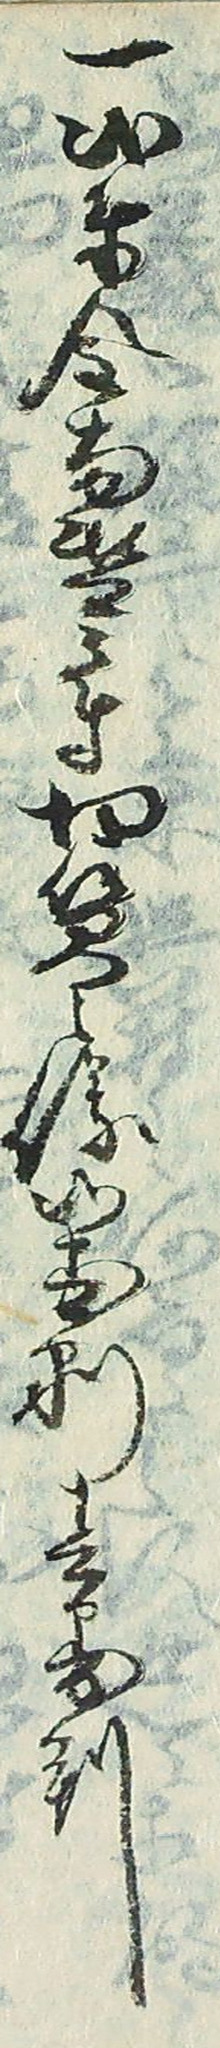一弐朱金両替に付切賃之儀弐歩判壱歩判
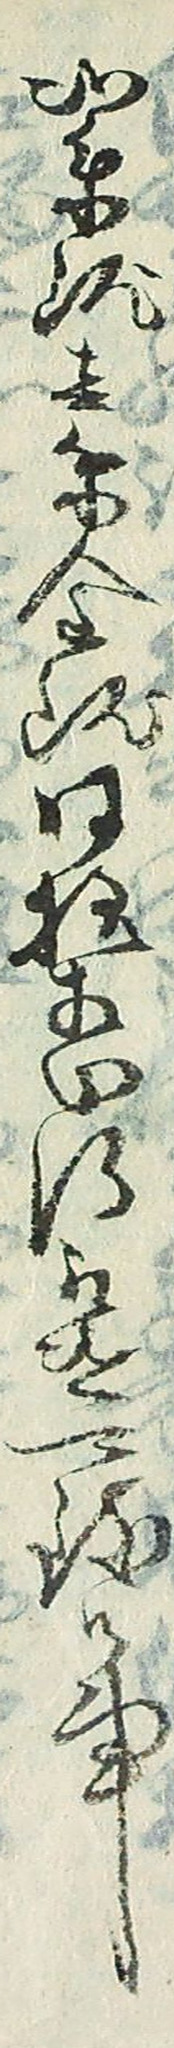弐朱銀壱朱金銀同様相心得取替可致候事
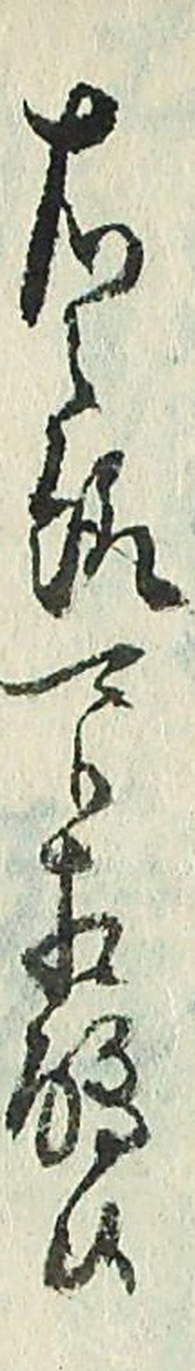右之趣可被相触候
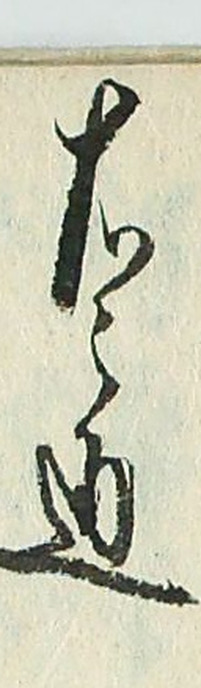右之通
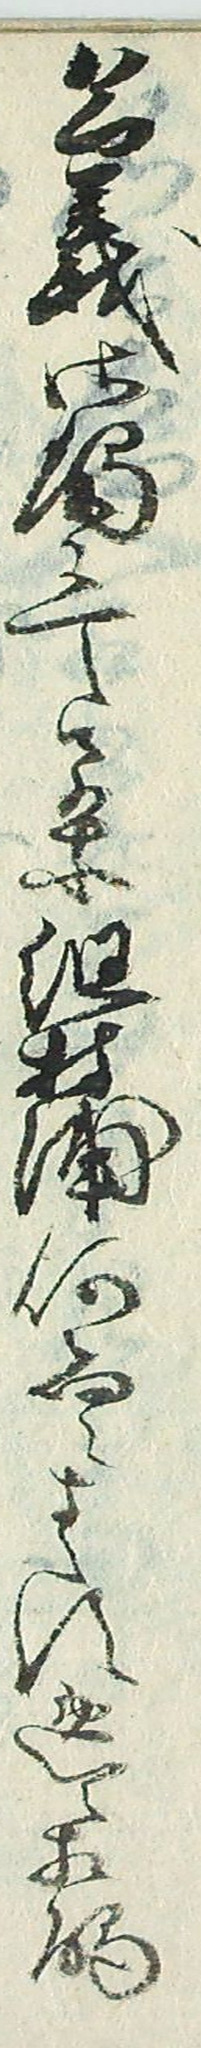公義御触有之候条組村浦何者によらす逸々相触
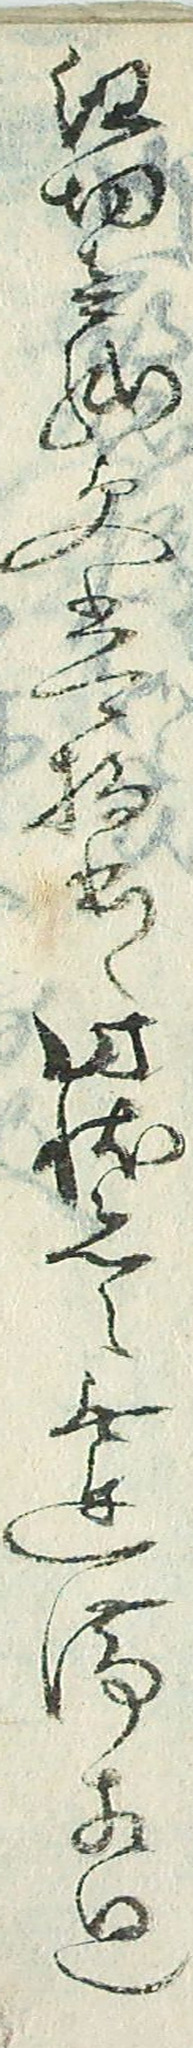組切壱紙受書可指出候此状先々無遅滞相廻
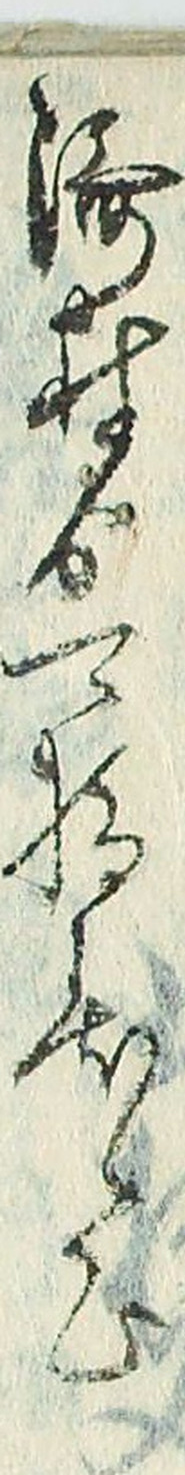済村ゟ可指戻候以上
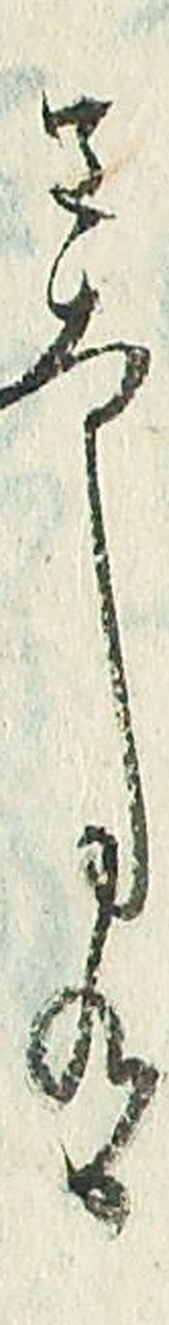閏十一月九日
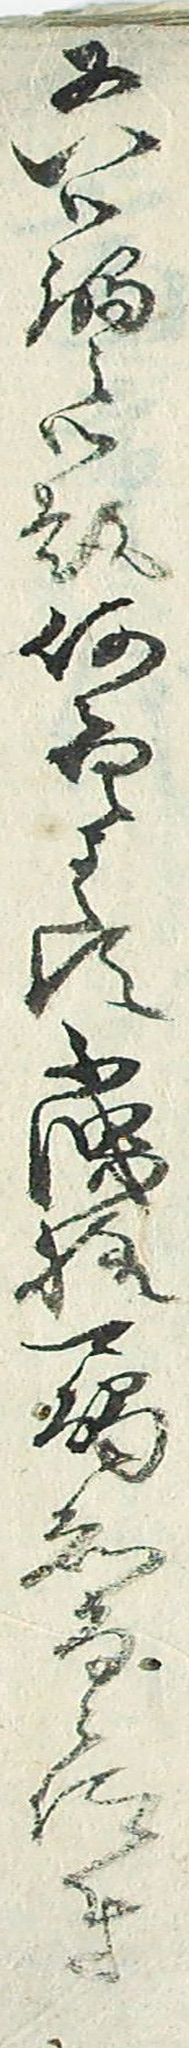右御触之御趣何者によらす不洩様可触知旨被仰付

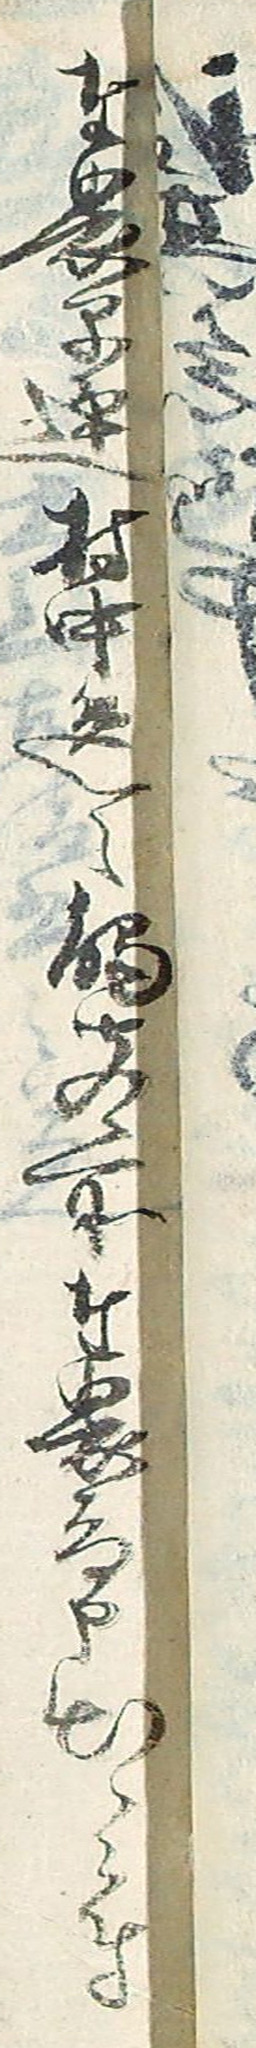奉畏早速村中逸々触聞候所奉畏旨申出候に付
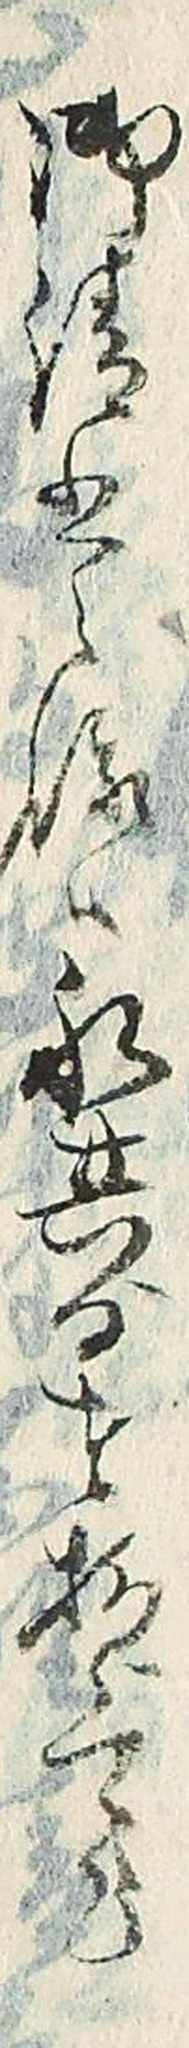御請書之儀は私共ゟ奉指上候以上
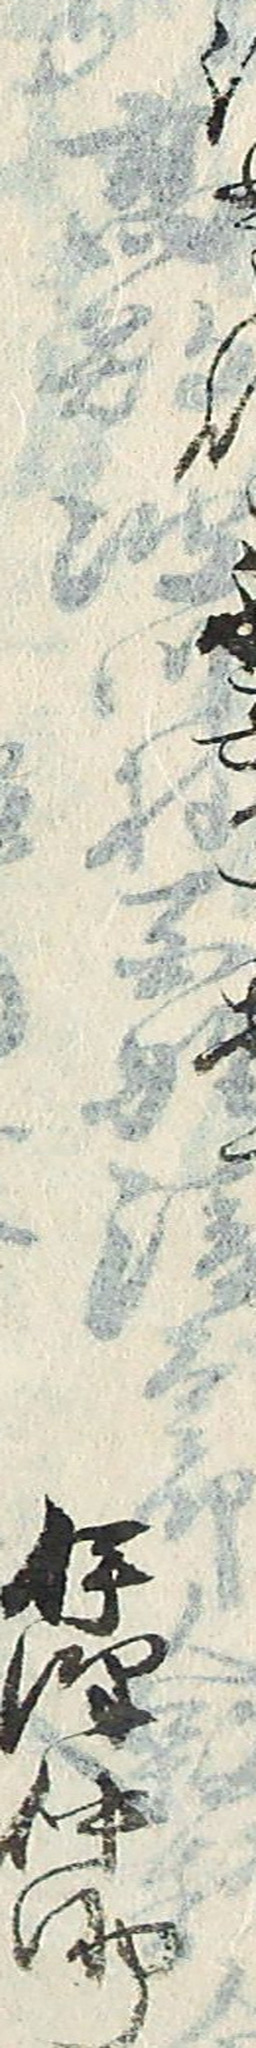伊澤仲助
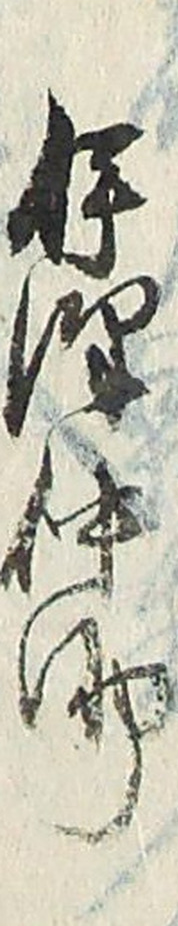伊澤仲助
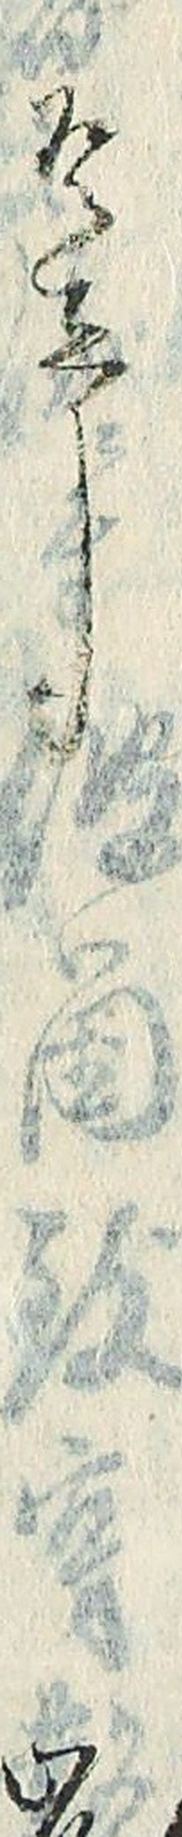辰十一月
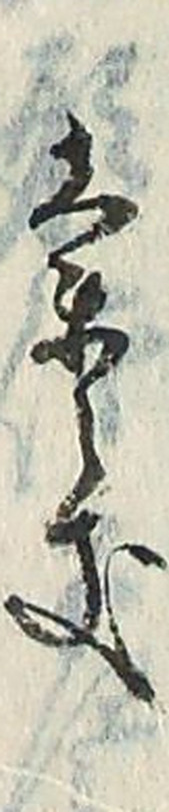久米之丈
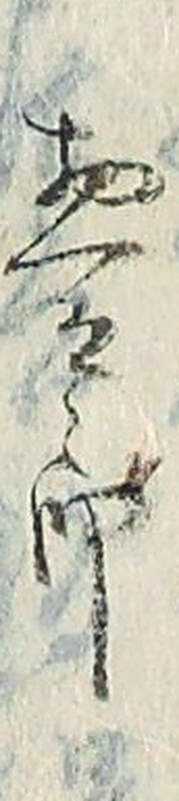惣太郎
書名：諸御用御□受書控
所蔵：鳴門教育大学 Naruto University of Education
